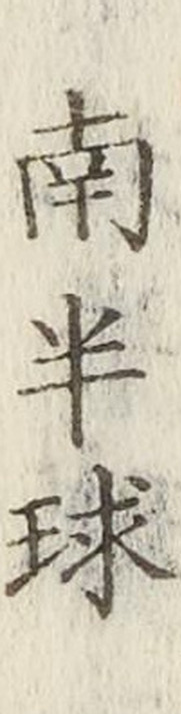南半球
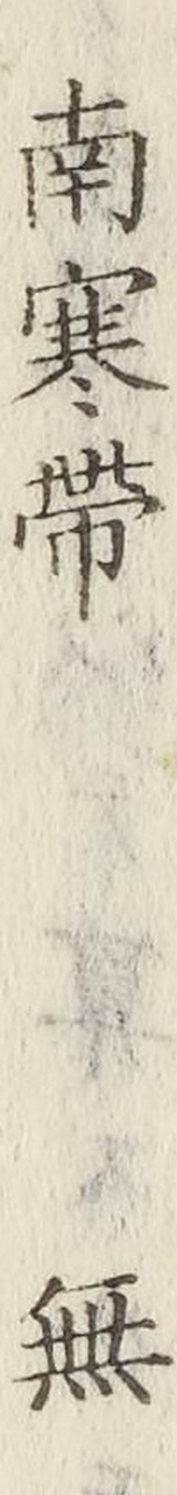南寒帯無
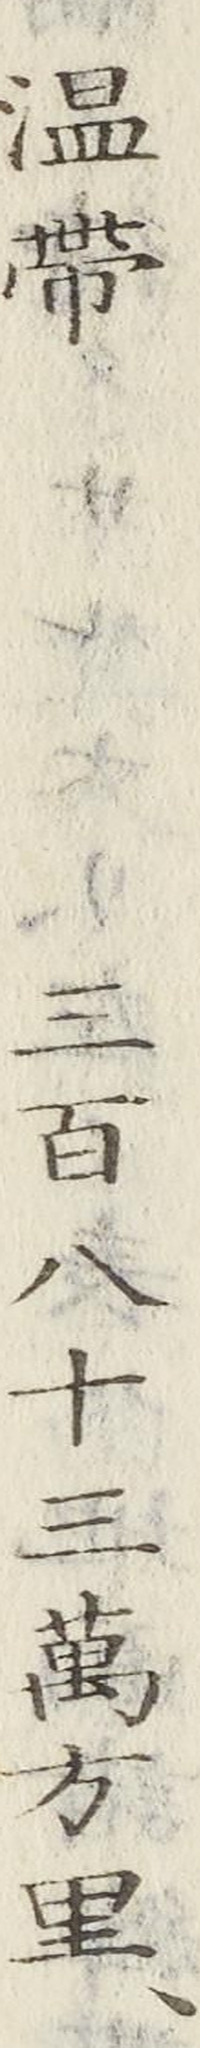温帯三百八十三万方里、
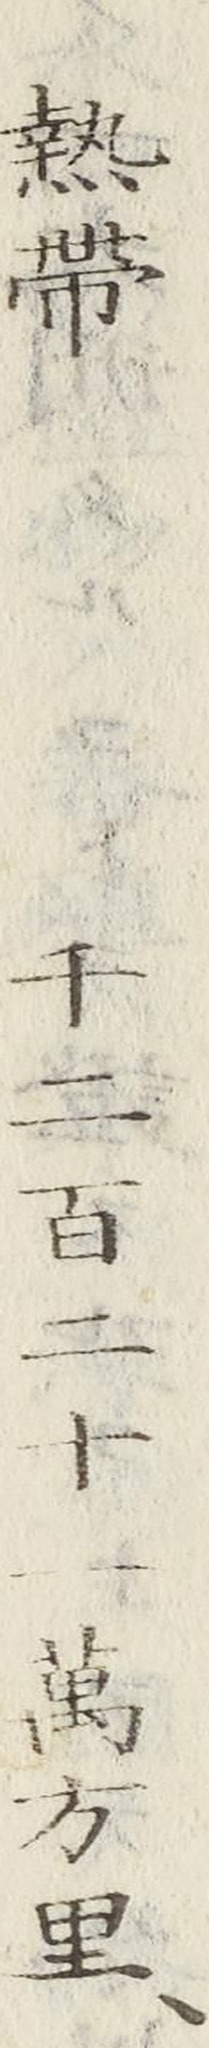熱帯千二百二十一万方里、
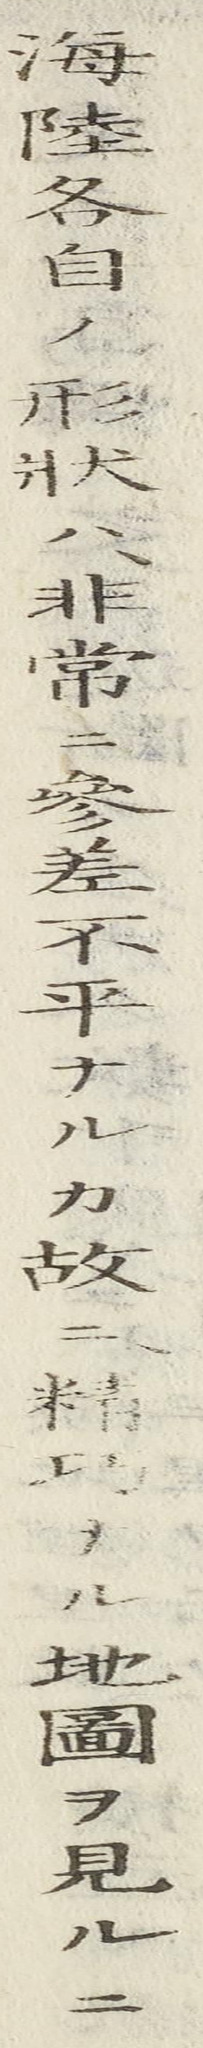海陸各自ノ形状ハ、非常ニ参差不平ナルカ故ニ、精巧ナル地図ヲ見ルニ
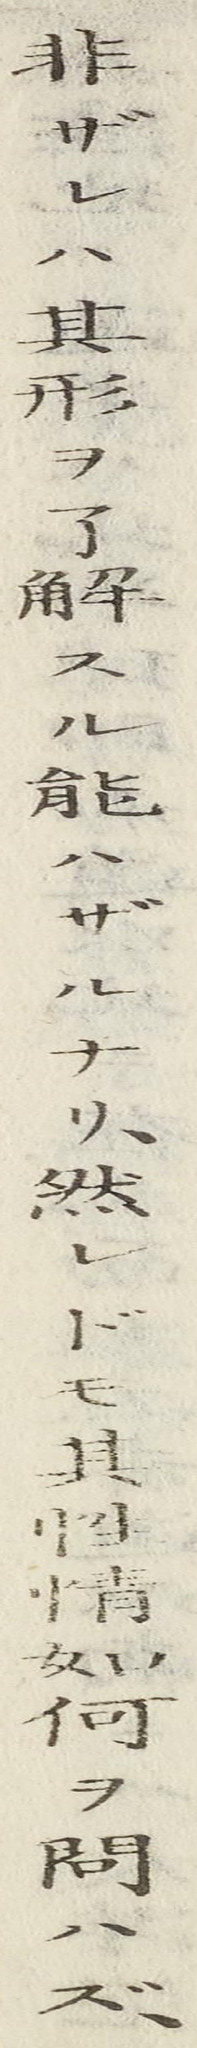非ザレハ其形ヲ了解スル能ハザルナリ、然レドモ其性情如何ヲ問ハズ、
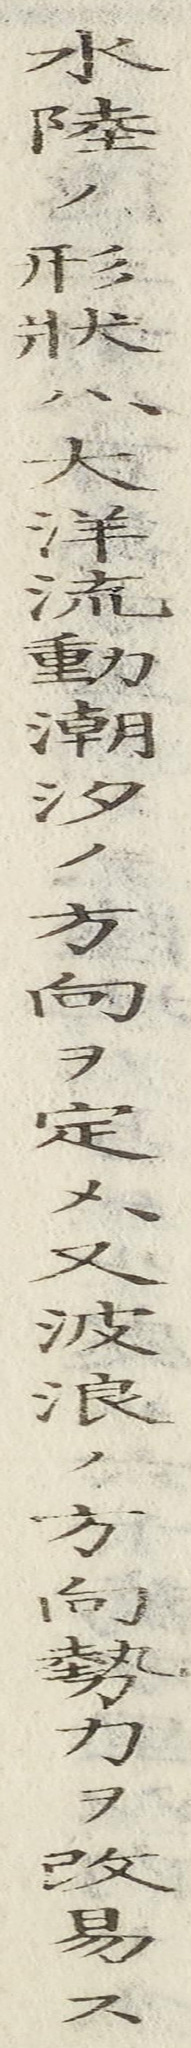水陸ノ形状ハ、大洋流動潮汐ノ方向ヲ定メ、又波浪ノ方向勢力ヲ改易ス
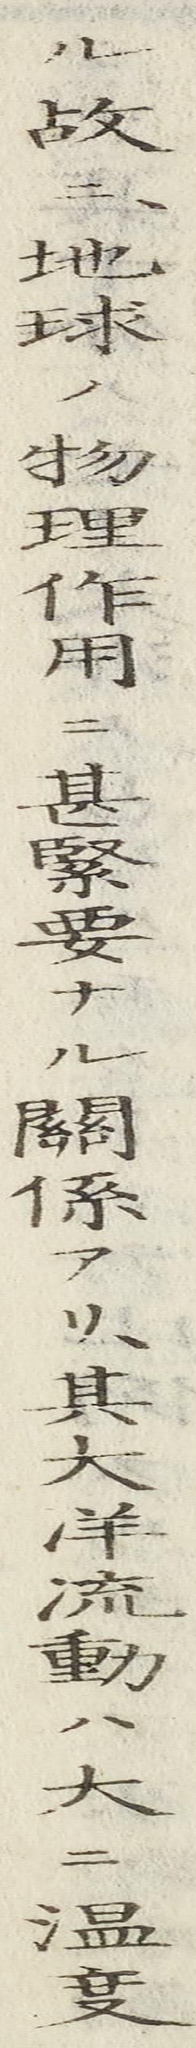ル故ニ、地球ノ物理作用ニ甚緊要ナル関係アリ、其大洋流動ハ大ニ温度
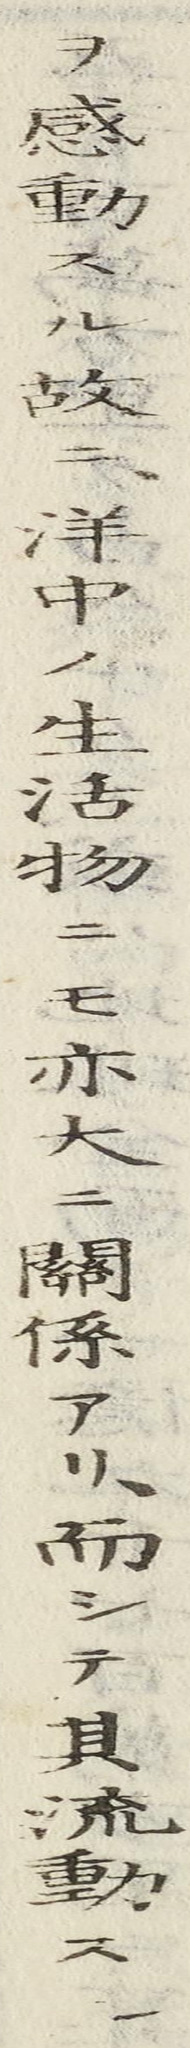ヲ感動スル故ニ、洋中ノ生活物ニモ亦大ニ関係アリ、而シテ其流動スル
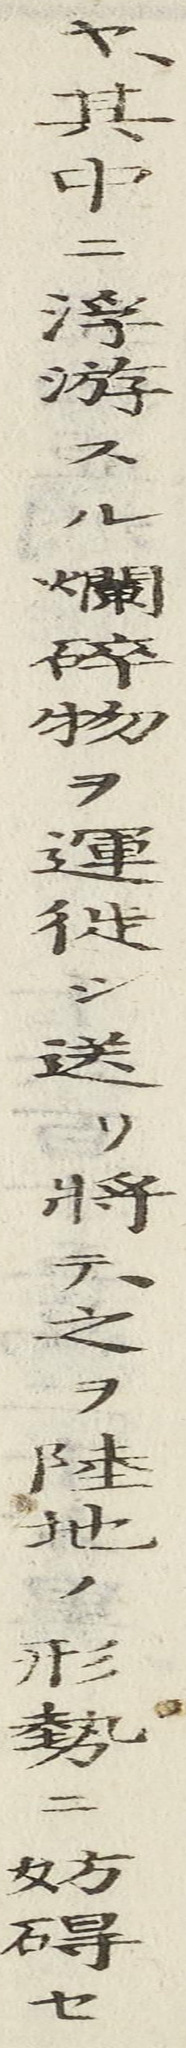ヤ、其中ニ浮游スル爛砕物ヲ運徒シ送リ将テ、之ヲ陸地ノ形勢ニ妨碍セ
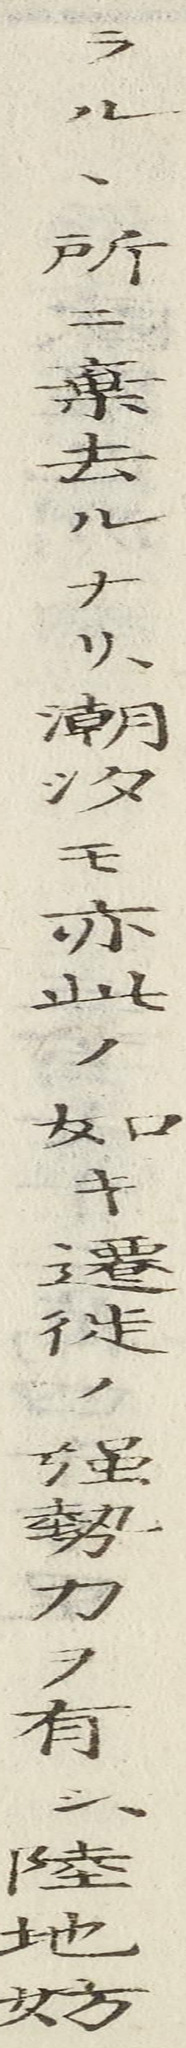ラルヽ所ニ棄去ルナリ、潮汐モ亦此ノ如キ遷徒ノ強勢力ノ有シ、陸地妨
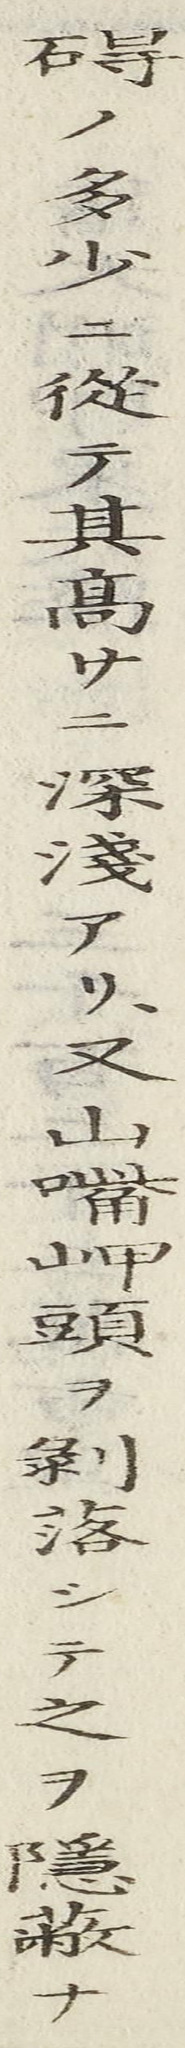碍ノ多少ニ従テ其高サニ深浅アリ、又山嘴岬頭ヲ剥落シテ之ヲ隠蔽ナ
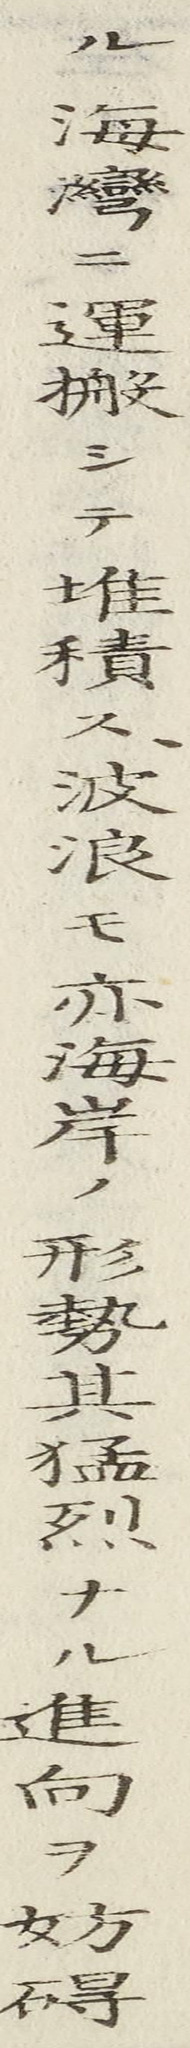ル海湾ニ運搬シテ堆積ス、波浪モ亦海岸ノ形勢其猛烈ナル進向ヲ妨碍
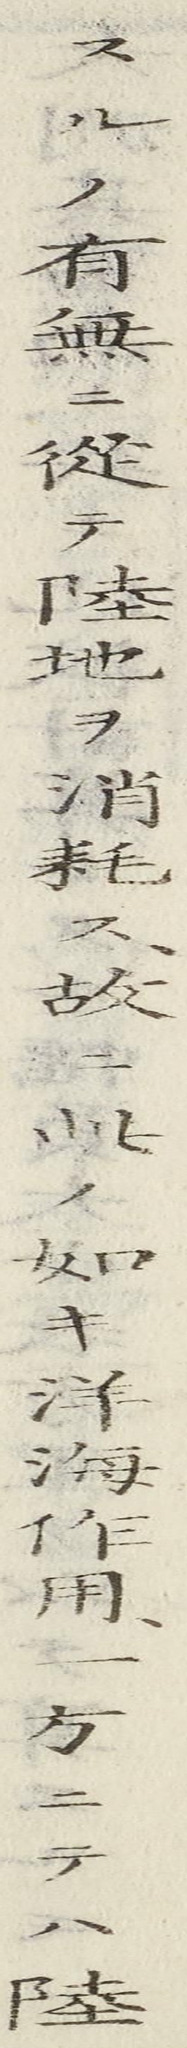スルノ有無ニ従テ陸地ヲ消耗ス、故ニ此ノ如キ洋海作用、一方ニテハ陸
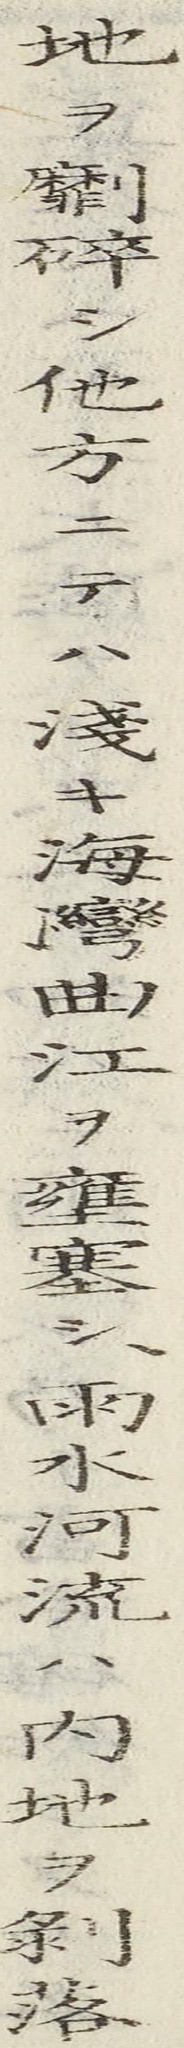地ヲ劘砕シ他方ニテハ浅キ海湾曲江ヲ壅塞シ、雨水河流ハ内地ヲ剥落
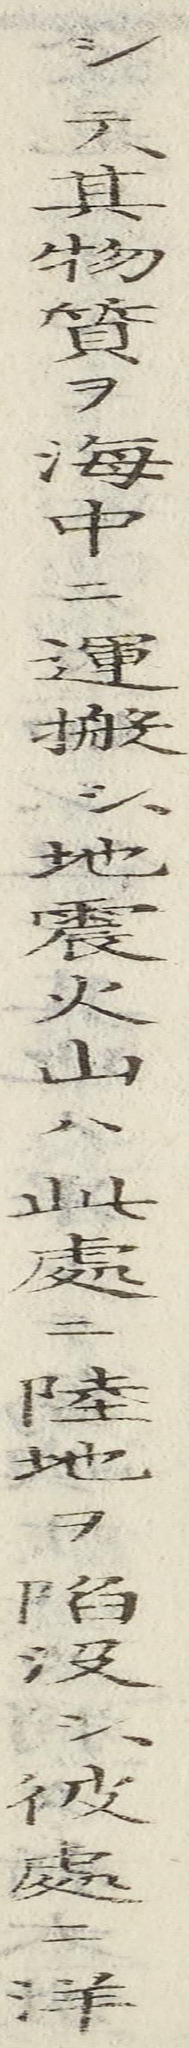シテ、其物質ヲ海中ニ運搬シ、地震火山ハ此処ニ陸地ヲ陥没シ、彼処ニ洋
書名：百科全書　地文學　全
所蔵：東京大学地震研究所図書室 Earthquake Research Institute Library, The University of Tokyo, JAPAN
